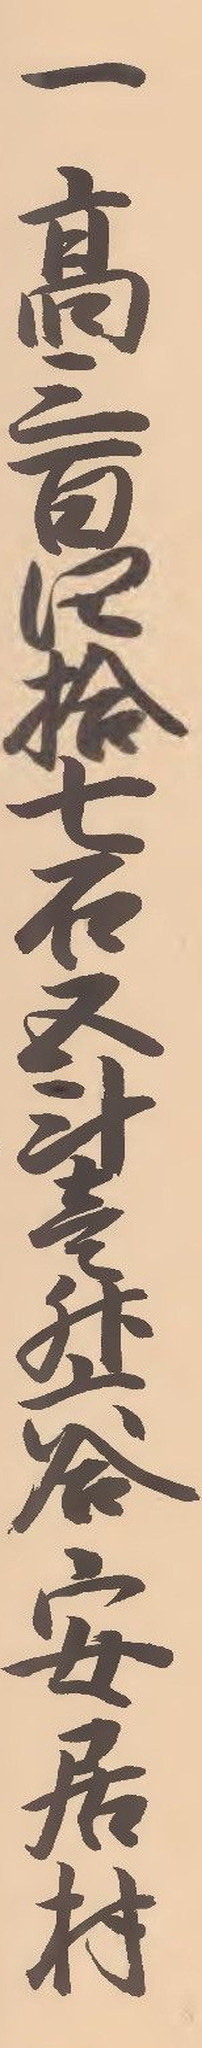一髙三百四拾七石五斗壱升六合安居村
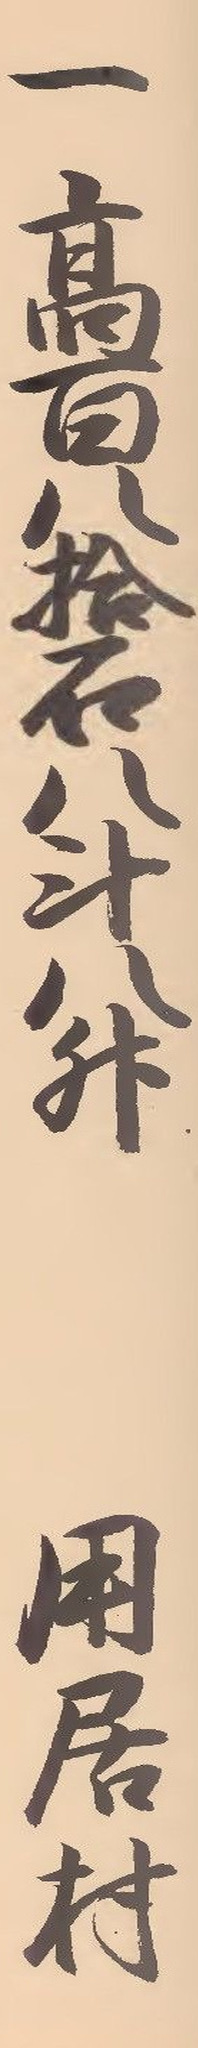一髙百八拾石八斗八升用居村
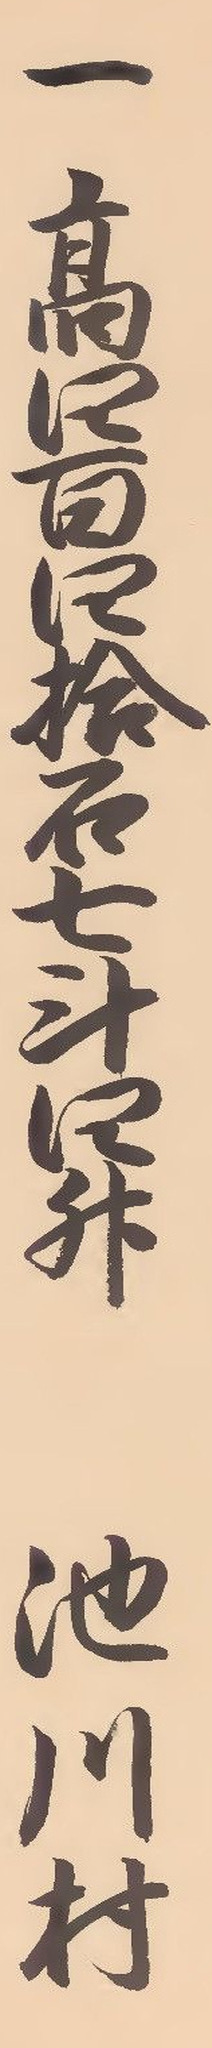一髙四百四拾石七斗四升池川村
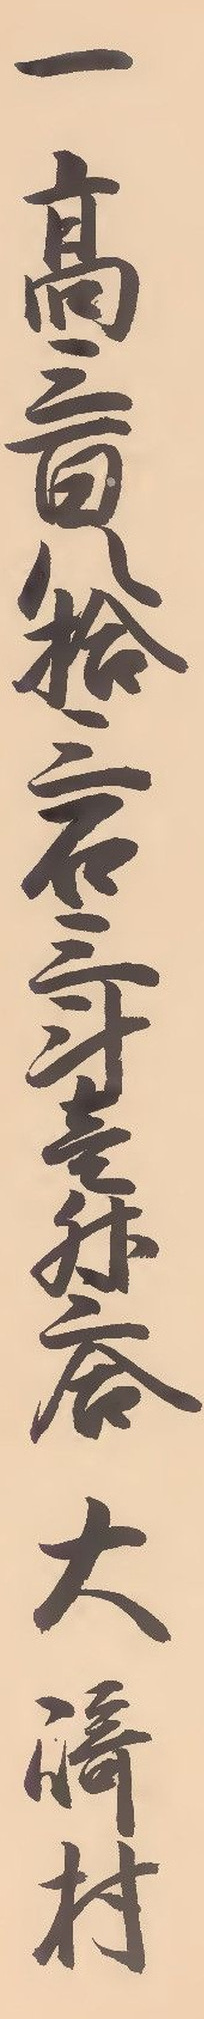一髙三百八拾三石三斗壱升二合大崎村

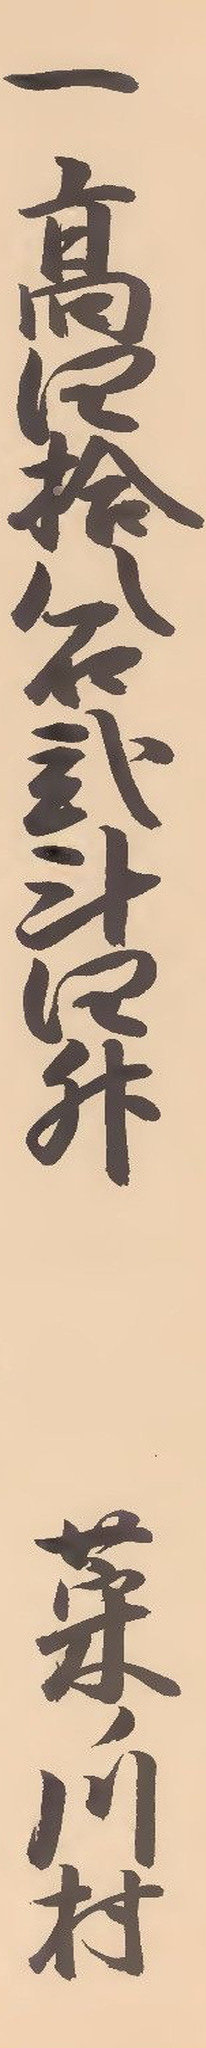一髙四拾八石弐斗四升菜ノ川村
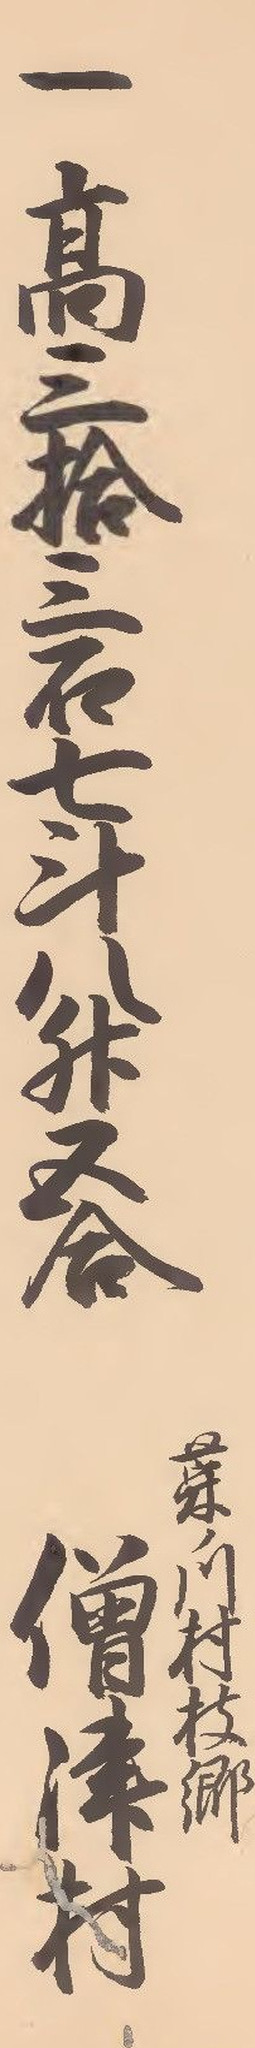一髙三拾三石七斗八升五合僧津村
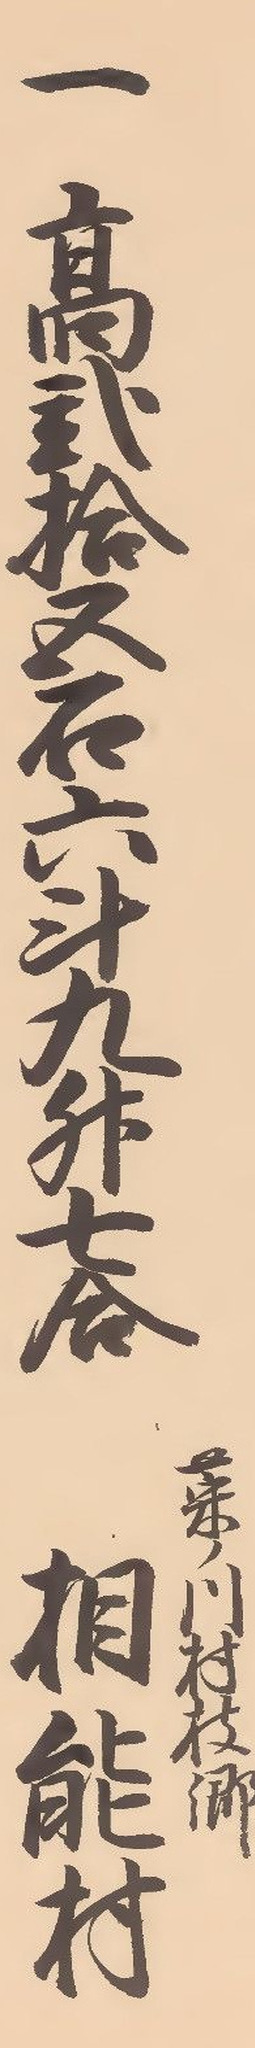一髙弐拾五石六斗九升七合相能村
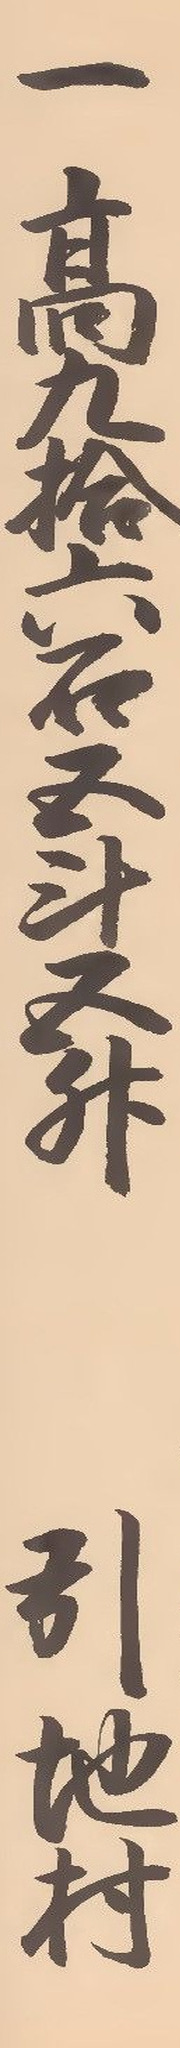一髙九拾六石五斗五升引地村
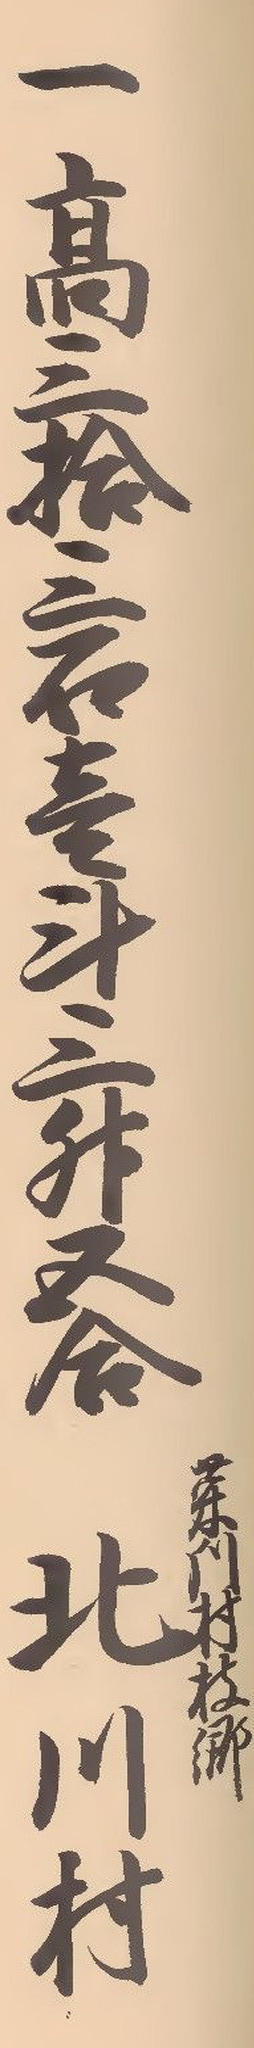一髙三拾三石壱斗三升五合北川村
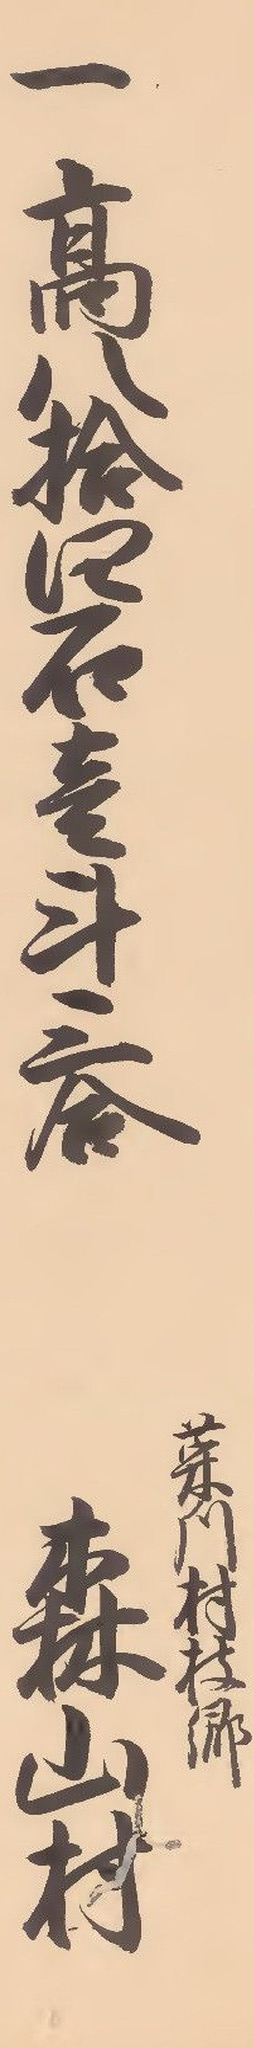一髙八拾四石壱斗三合森山村

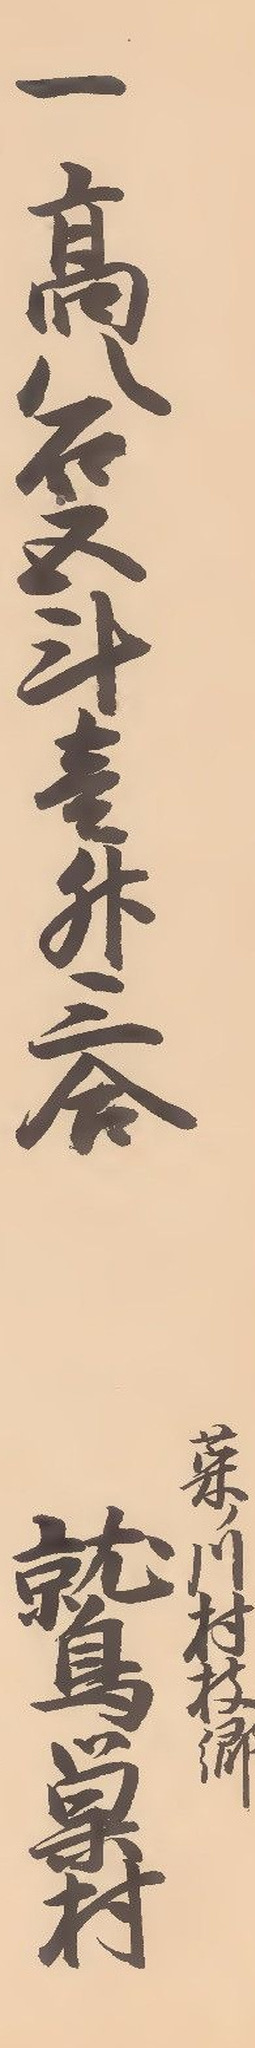一髙八石五斗壱升三合鷲巣村
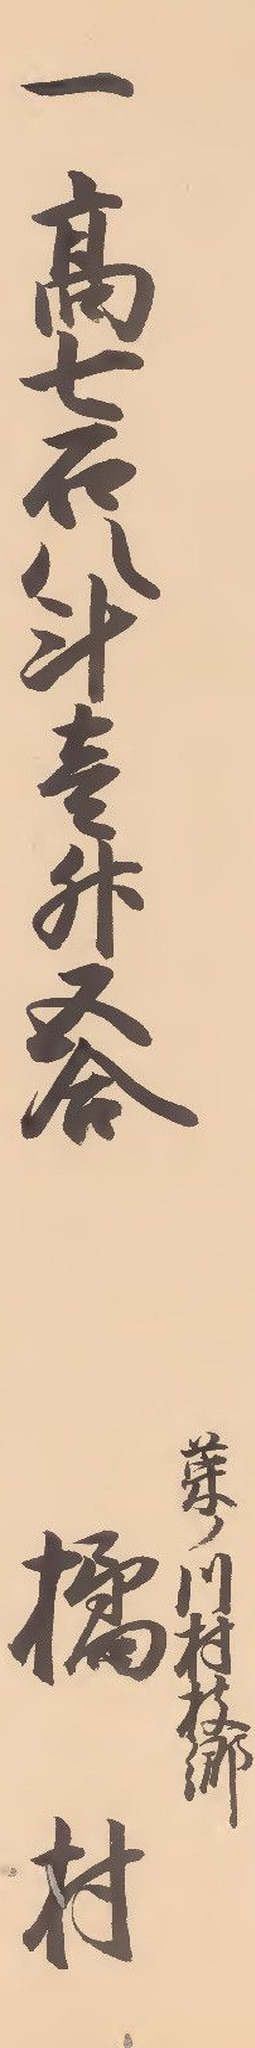一髙七石八斗壱升五合橘村
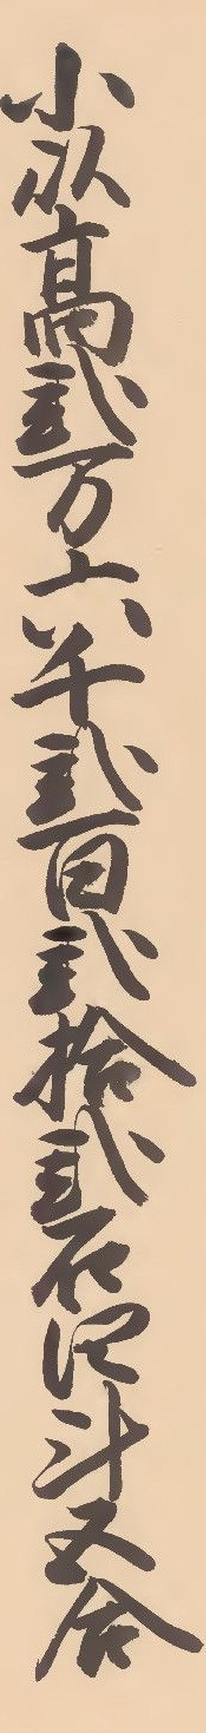小以髙弐万六千弐百弐拾弐石四斗五合
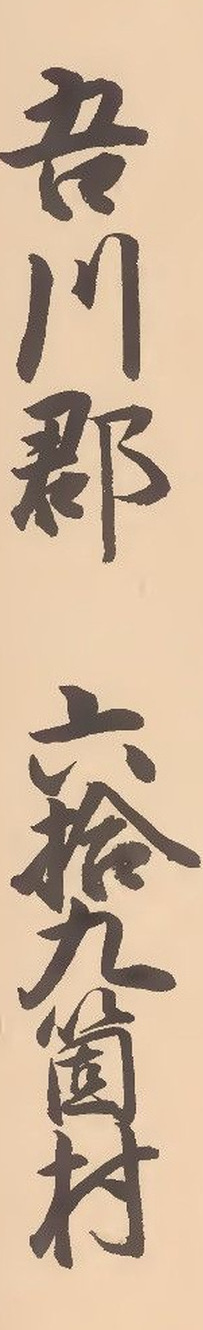吾川郡六拾九箇村
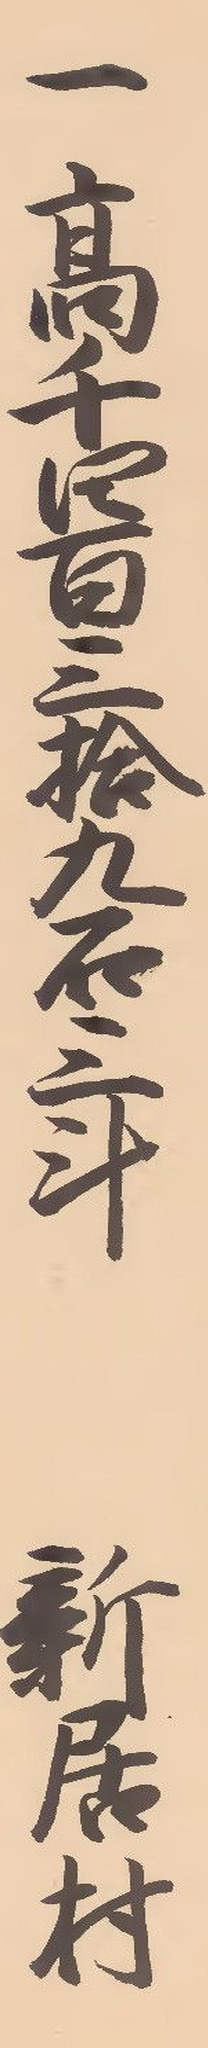一髙千四百三拾九石三斗新居村
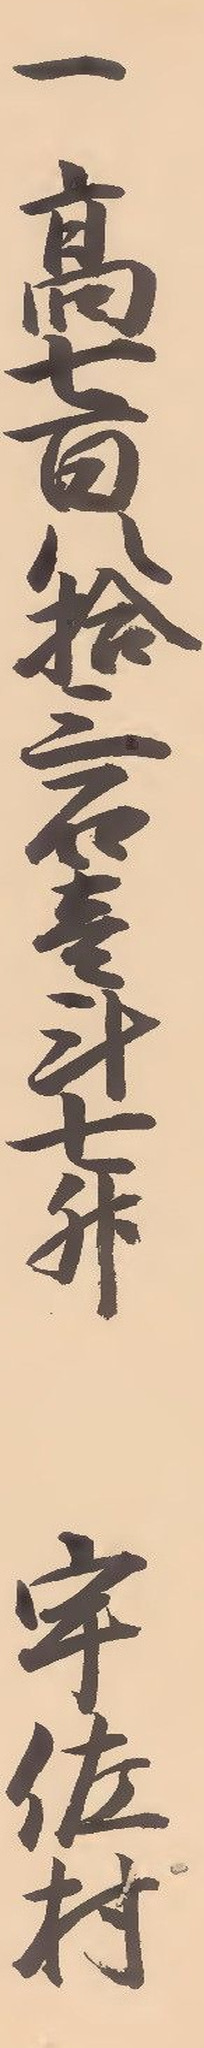一髙七百八拾三石壱斗七升宇佐村
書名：土佐国郷帳
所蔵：国立公文書館 National Archives of Japan
